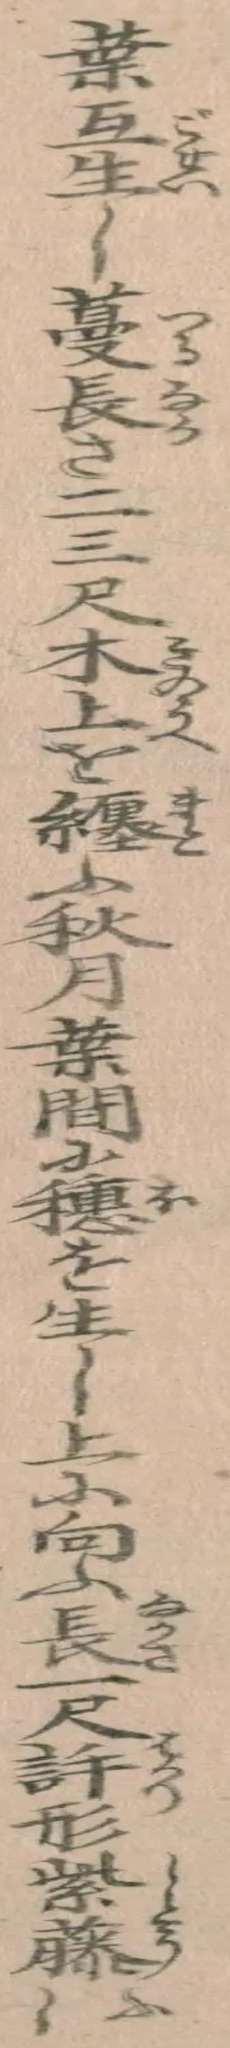葉互生し蔓長さ二三尺木上を纏ふ秋月葉間に穂を生し上に向ふ長一尺許形紫藤ふし
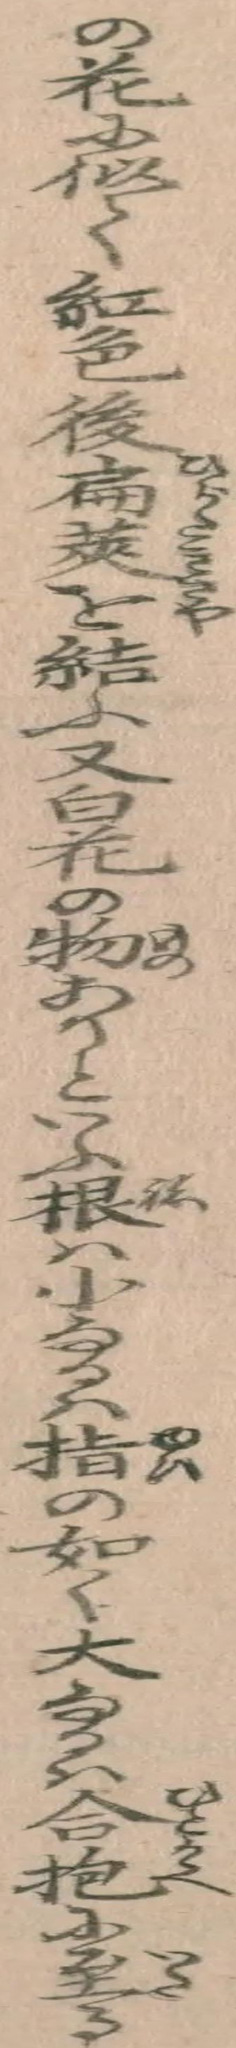の花に似て紅色後扁莢を結ふ又白花の物ありといふ根は小なるは指の如く大なるは合抱に至る
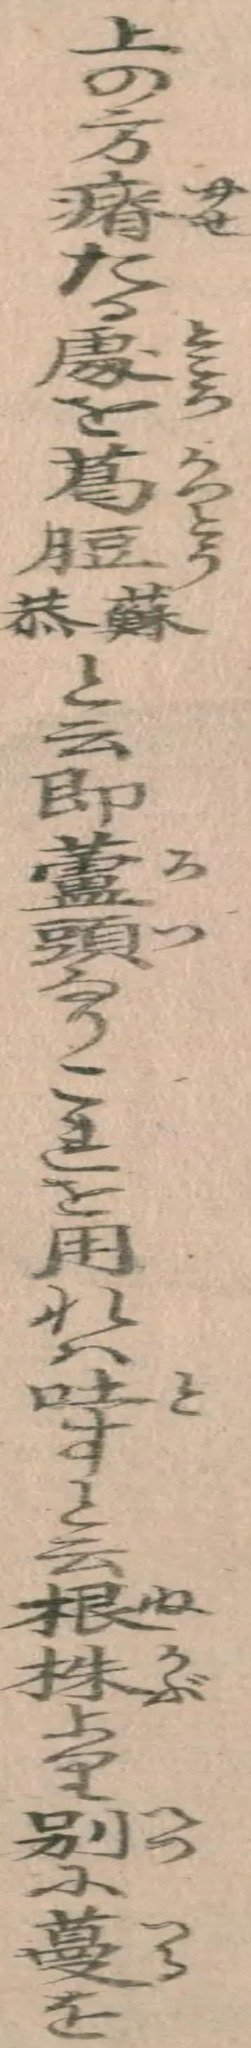上の方瘠たる処を葛脰蘇恭と云即芦頭なりこれを用れは吐すと云根株より別に蔓を
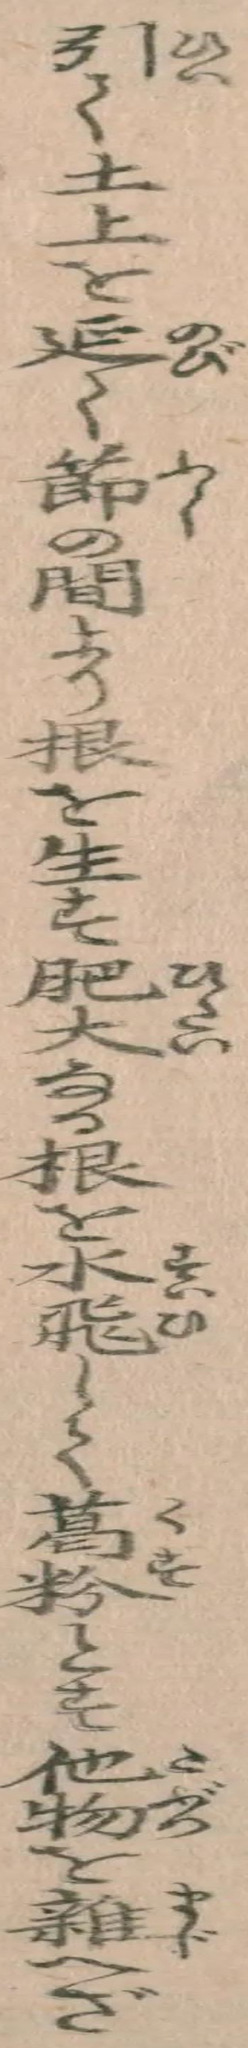引て土上を延て節の間より根を生す肥大なる根を水飛して葛粉とす他物を雑へざ
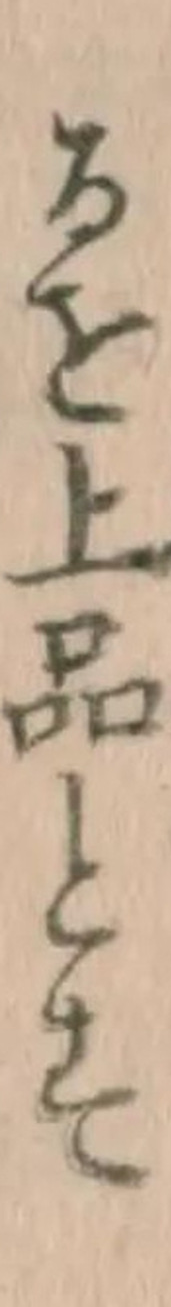るを上品とす
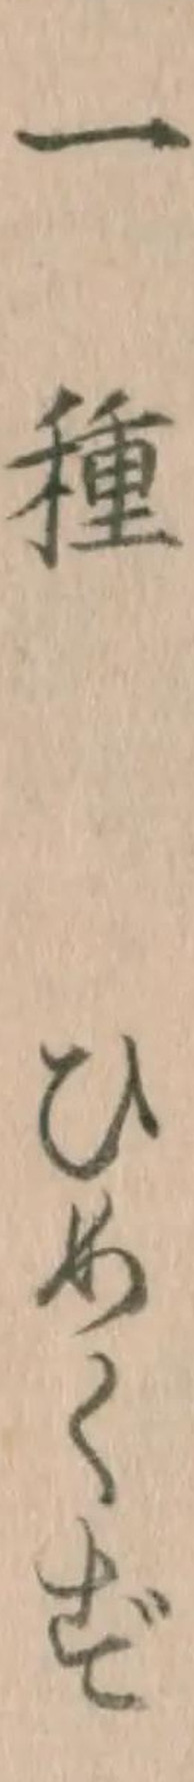一種ひめくず
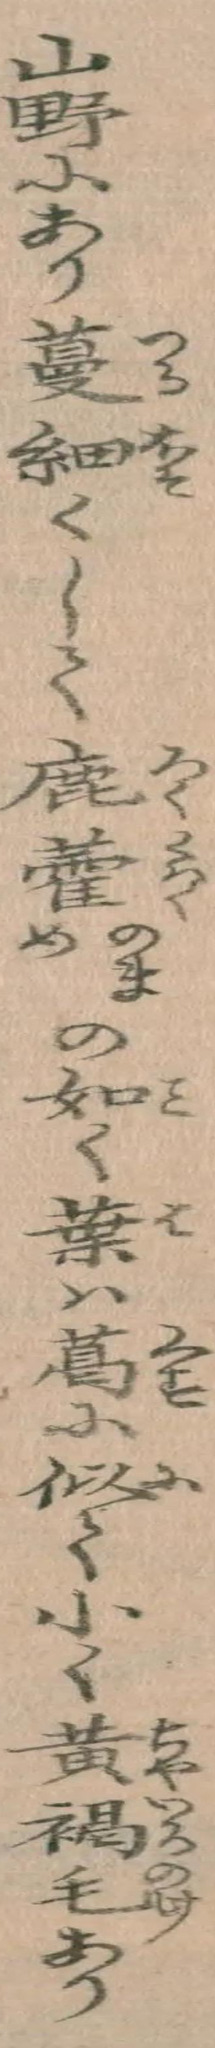山野にあり蔓細くして鹿藿のまめの如く葉は葛に似て小く黄褐毛あり
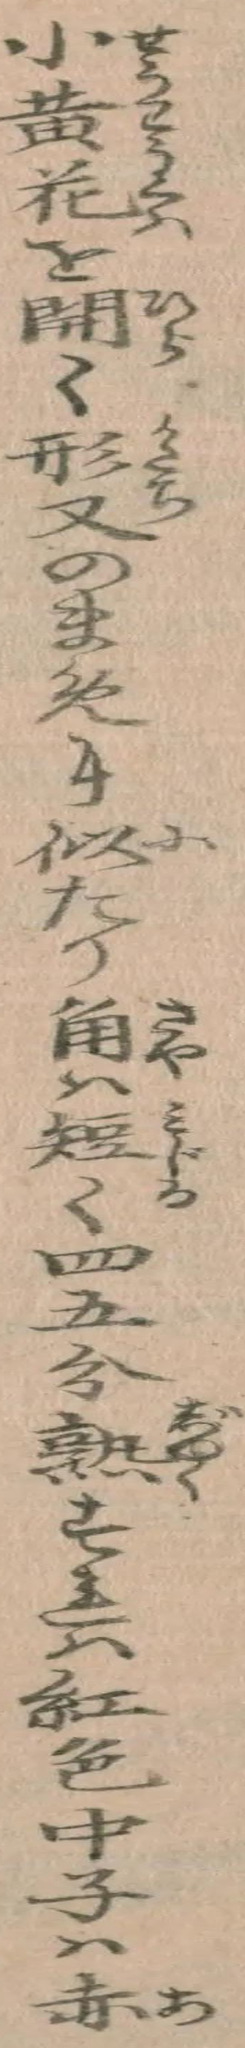小黄花を開く形又のまめに似たり角は短く四五分熟すれは紅色中子は赤
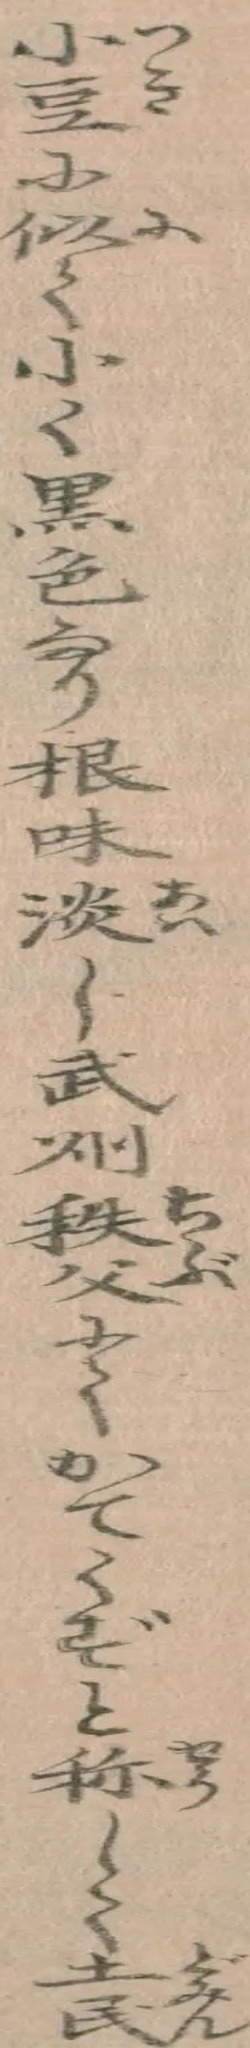小豆に似て小く黒色なり根味淡し武州秩父にてかてくずと称して土民
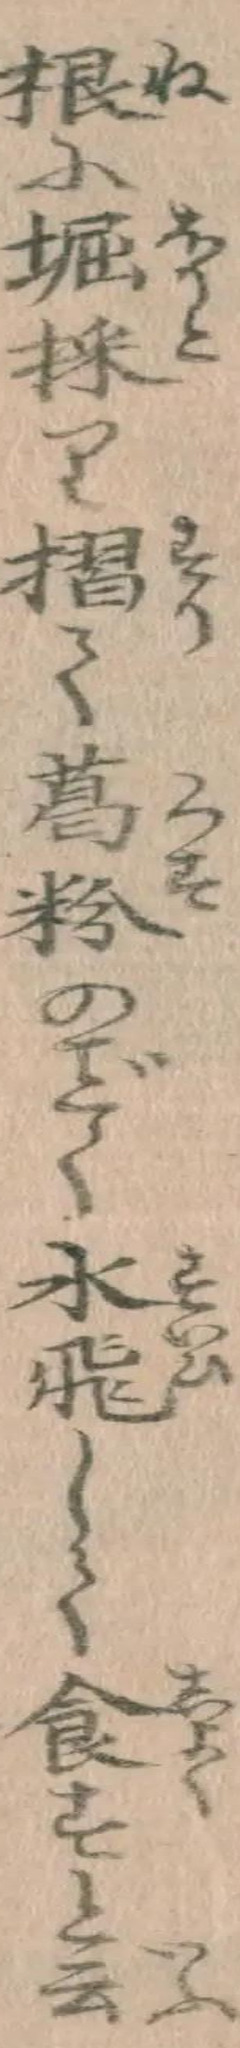根に堀採り摺て葛粉のごとく水飛して食すと云

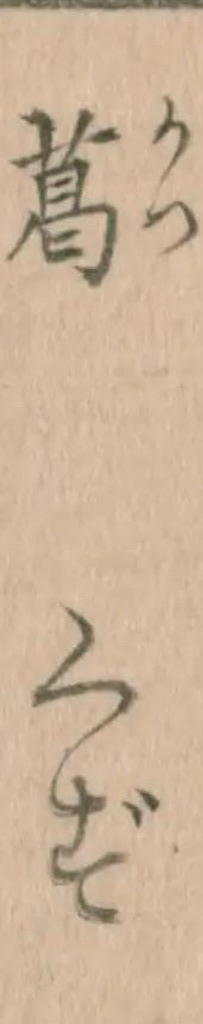葛くず

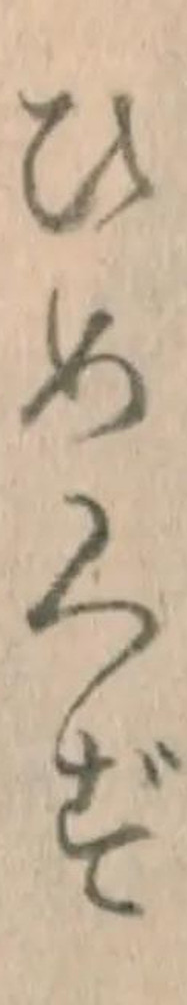ひめくず
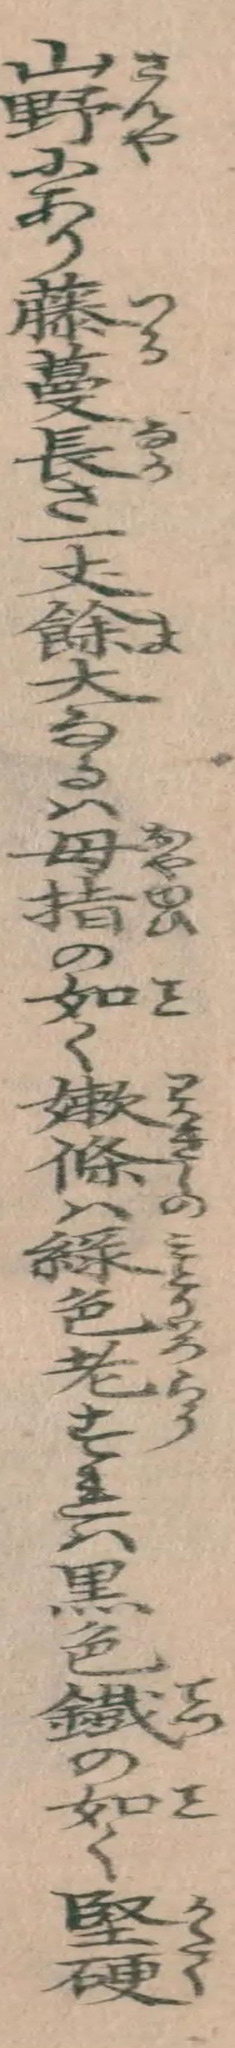山野にあり藤蔓長さ一丈余大なるは母指の如く嫩条は緑色老すれは黒色鉄の如く堅硬
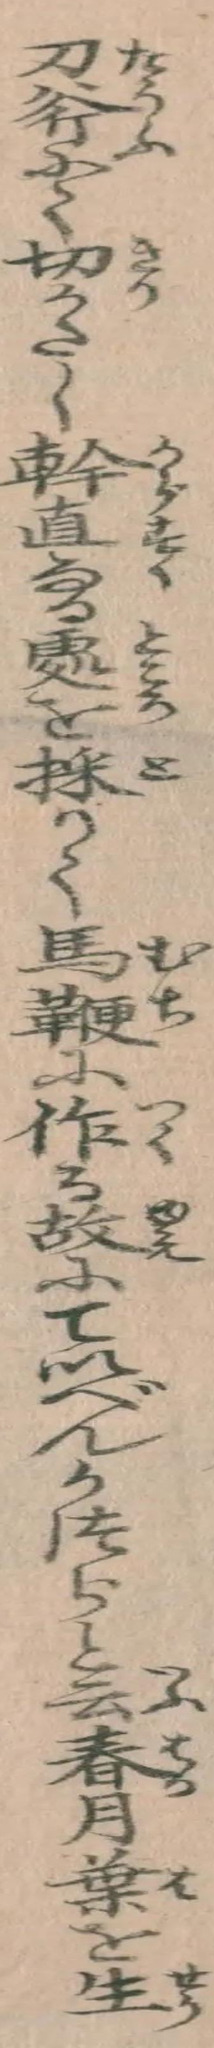刀斧にて切かたし幹直なる処を採りて馬鞭に作る故にてつべんかつらと云春月葉を生
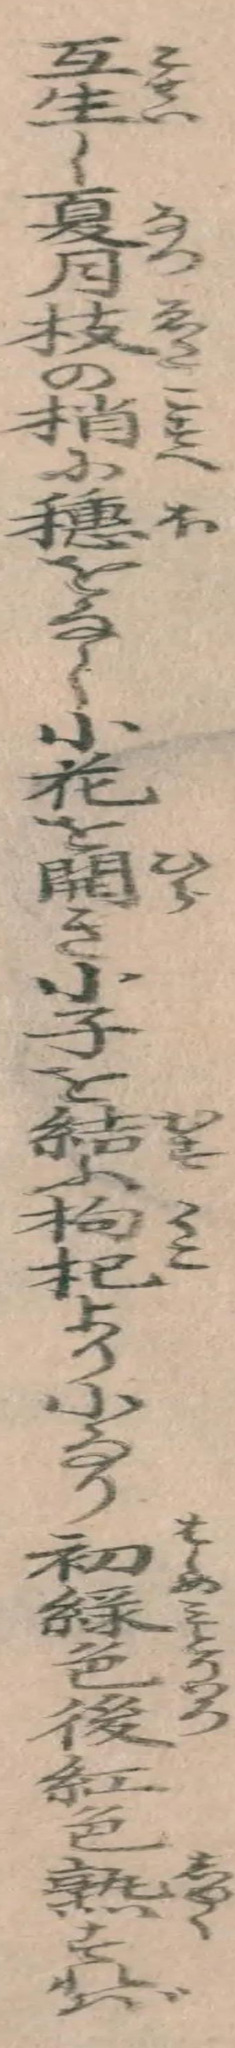互生し夏月枝の梢に穂をなし小花を開き小子を結ふ枸杞より小なり初緑色後紅色熟すれば
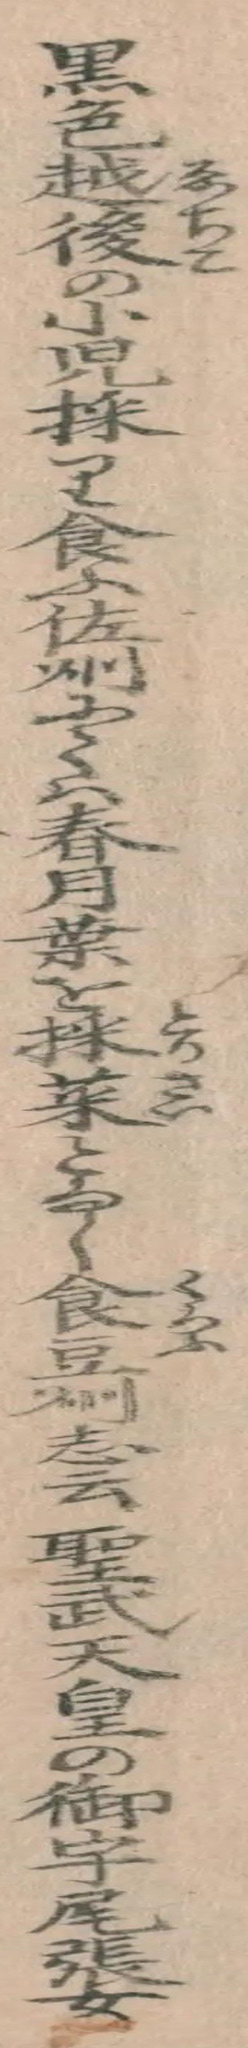黒色越後の小児採り食ふ佐州にては春月葉を採菜となし食豆州志云聖武天皇の御宇尾張女
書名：本草図譜. 巻25-27
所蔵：国立国会図書館 National Diet Library, JAPAN
